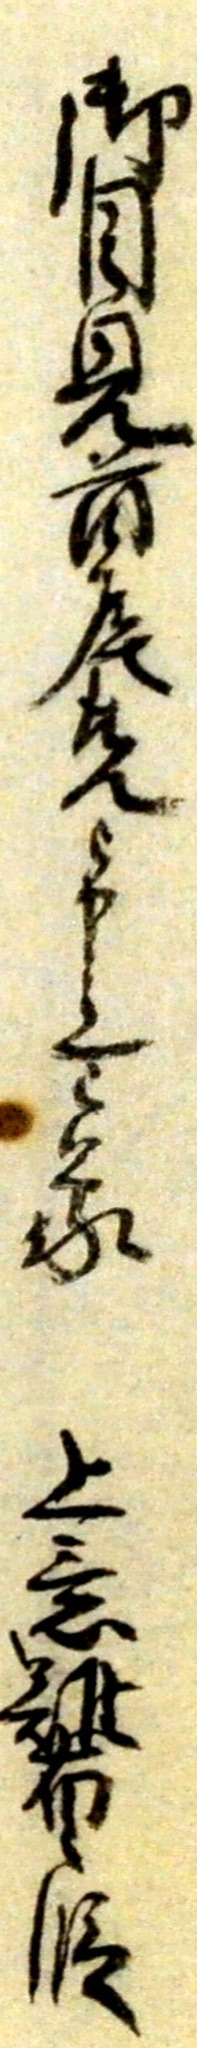御目見首尾先被申上ニ蒙上意難有候段
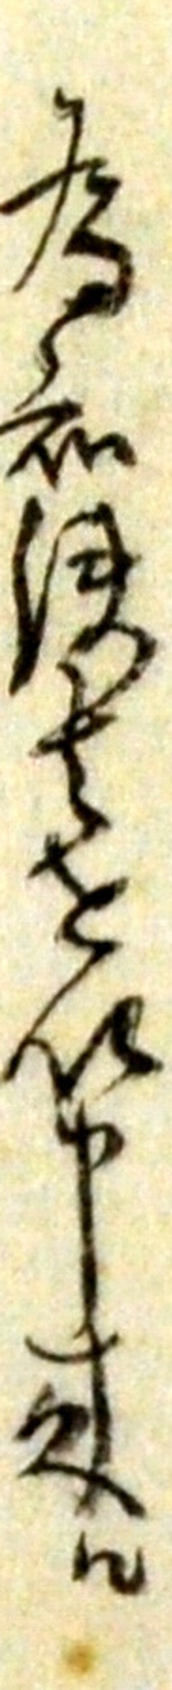為知使者を以申来ㇽ

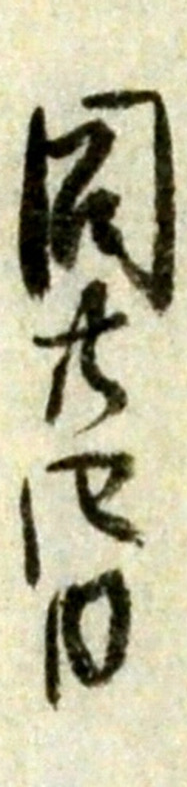同廿四日
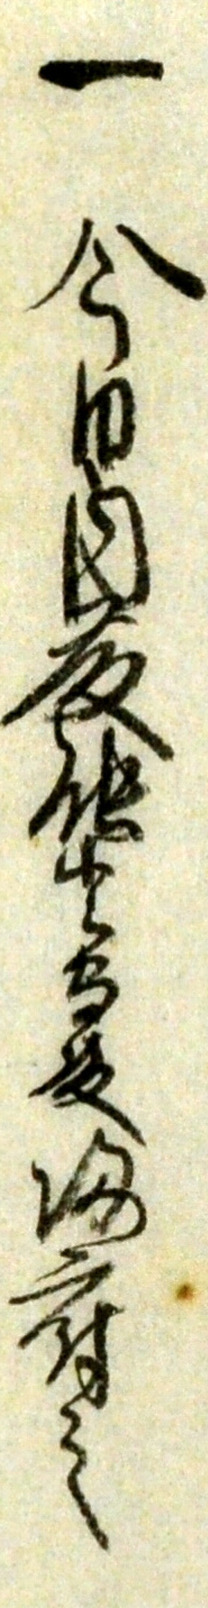一今日内藤能登守殿帰府之
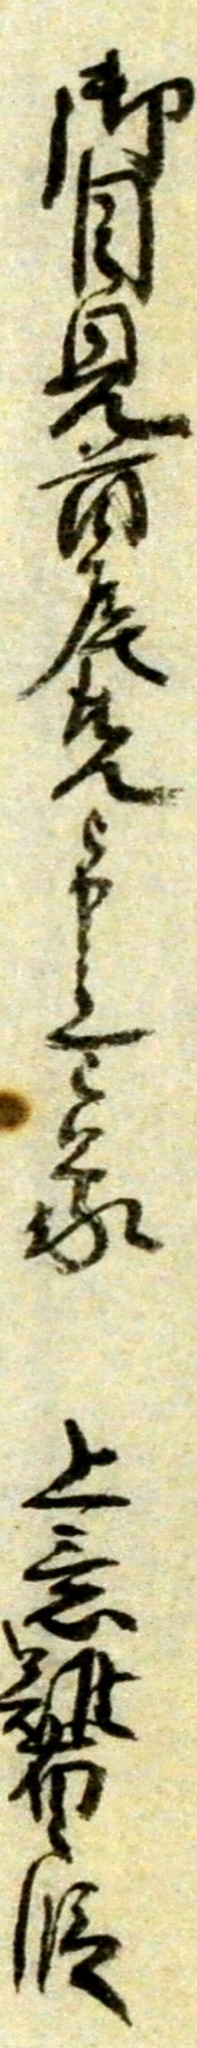御目見首尾克被申上蒙上意難有候段
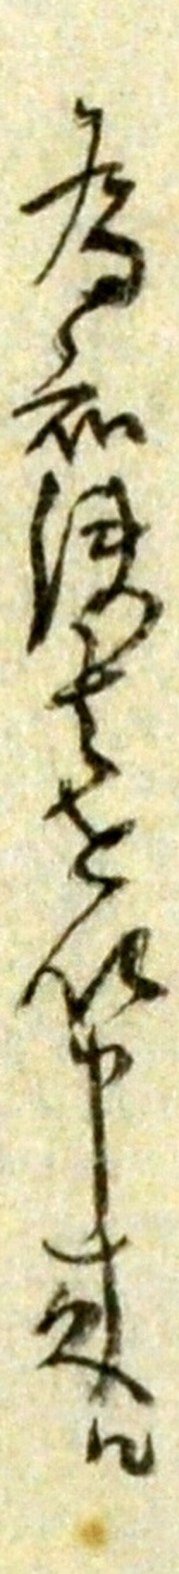為知使者を以申来
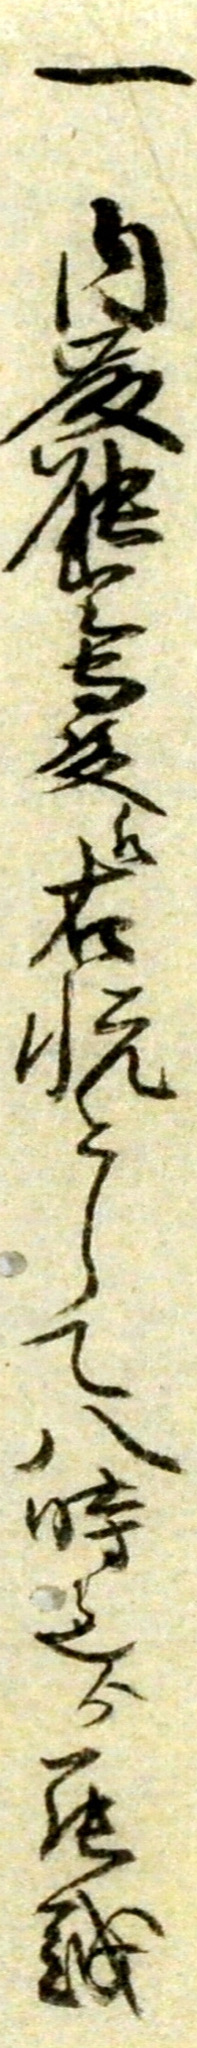一内藤能登守殿江右悦として八時過ゟ罷越
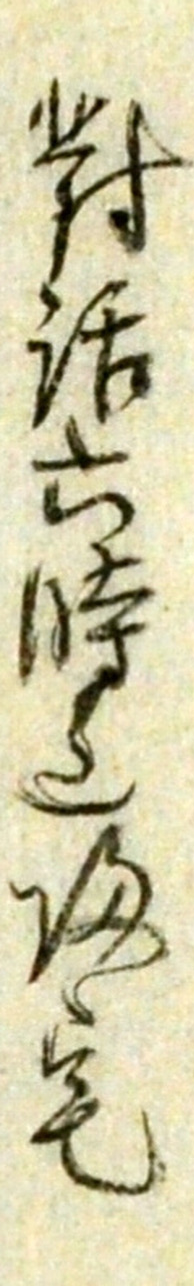対話六時過帰宅
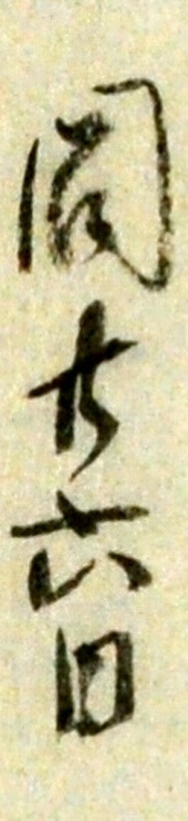同廿六日
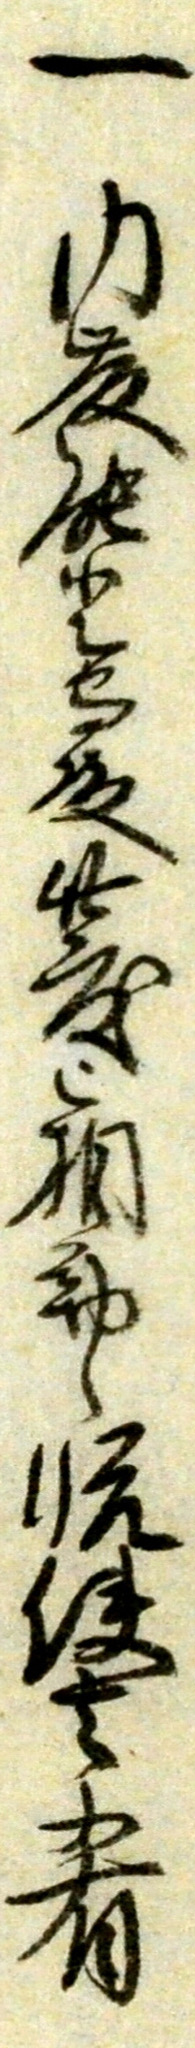一内藤能登守殿此度被相勤候悦使者肴
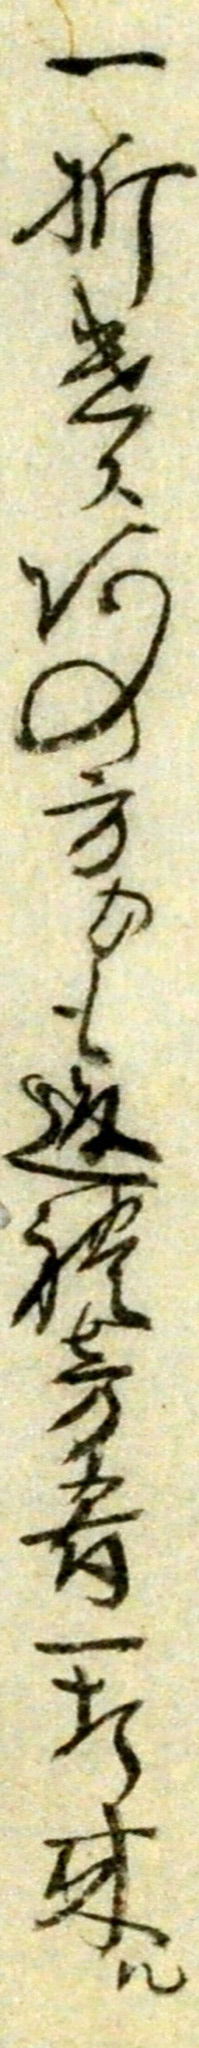一折遣ス河内方ゟも返礼旁肴一折来ル

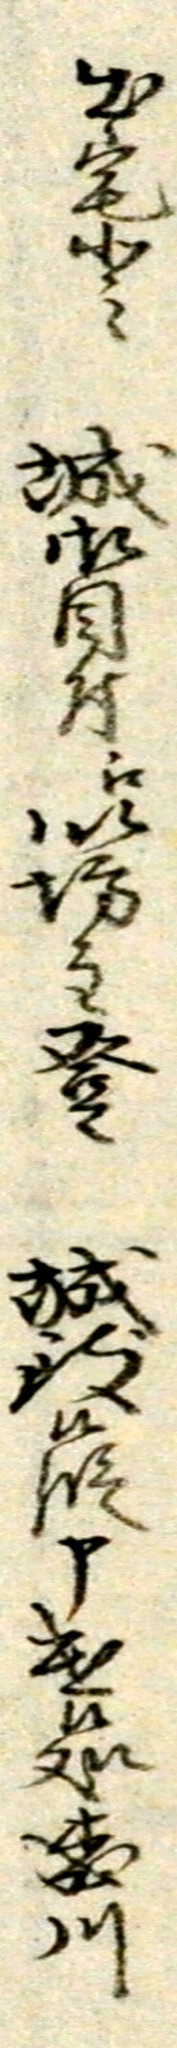出宅登城御目付江以坊主登城致候段申遣候処森川
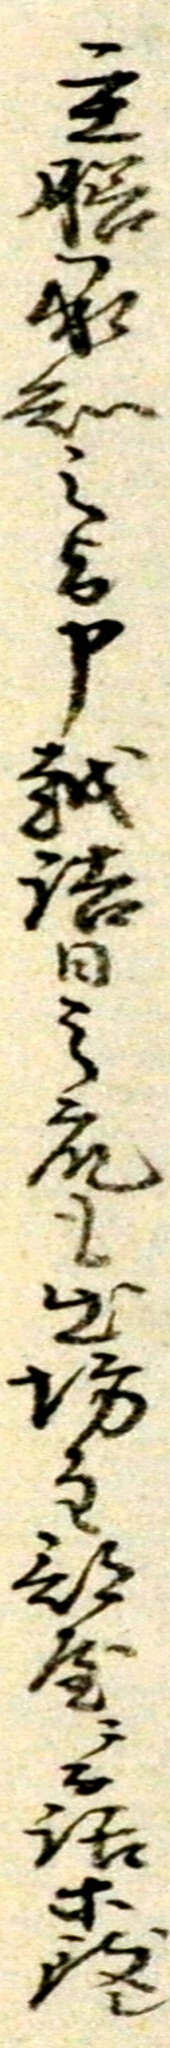主膳承知之旨申越詰日之衆も出坊主部屋ニ而話等致シ
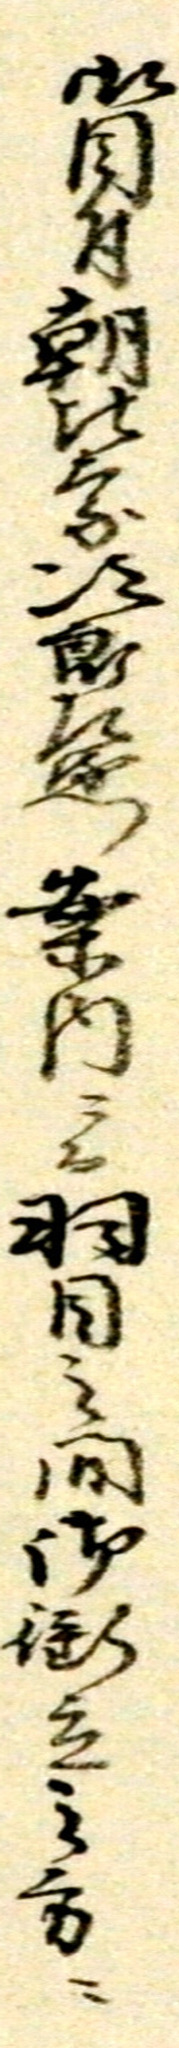御目付朝比奈次郎左衛門案内ニ而羽目之間御衝立之方ニ
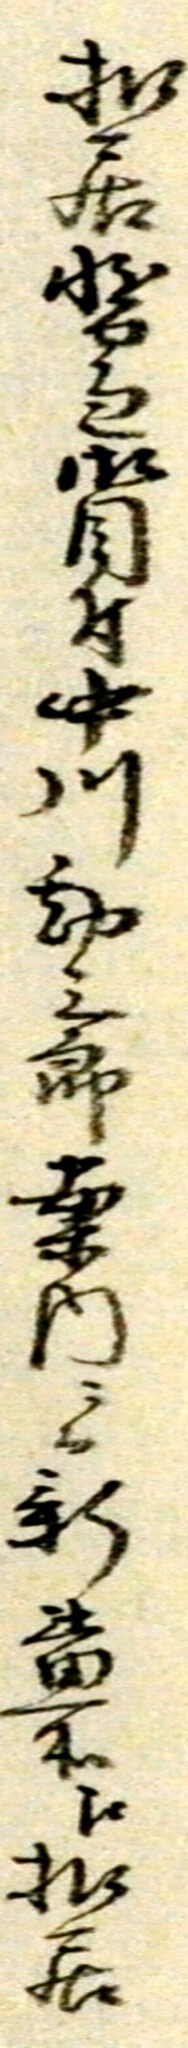扣居暫過御目付中川勘三郎案内ニ而新番所江扣居
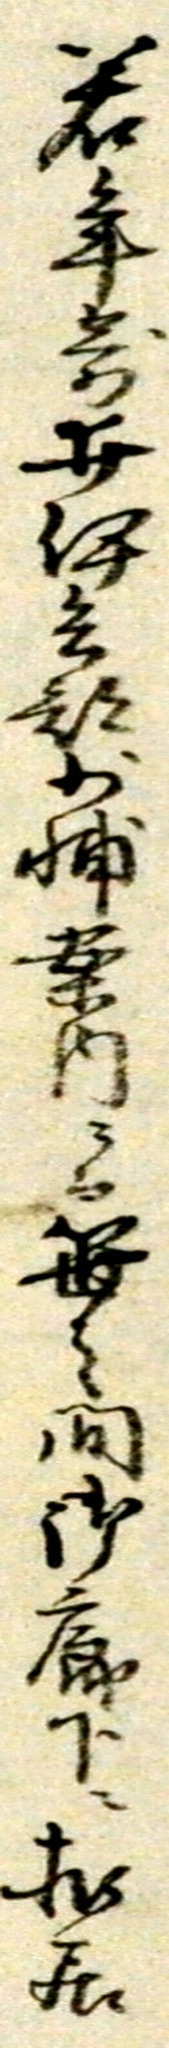若年寄井伊兵部少輔案内ニ而笹之間御廊下ニ扣居
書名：日光御名代相勤候節ノ留
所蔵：伊那市立高遠町図書館・合同会社AMANE
